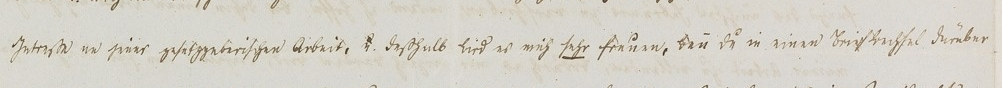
Intreße an jener gesetzgeberischen Arbeit, u. deßhalb wird es mich sehr freuen, wenn du in einen Briefwechsel darüber
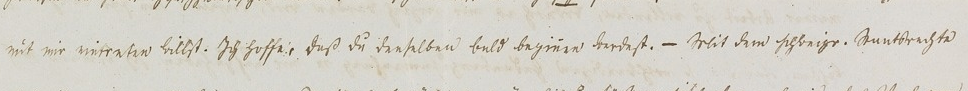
mit mir eintreten willst. Ich hoffe, daß du denselben bald beginnen werdest. – Mit dem schweizr. Staatsrechte
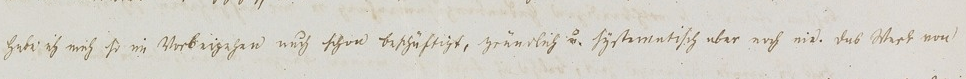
habe ich mich so im Vorbeigehen auch schon beschäftigt, gründlich u. systematisch aber noch nie. Das Werk von
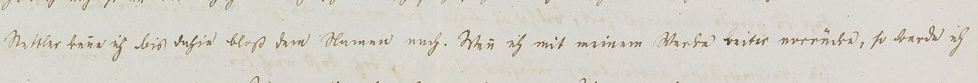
Stettler kenne ich bis dahin bloß dem Namen nach. Wenn ich mit meinem Werke weiter vorrücke, so werde ich
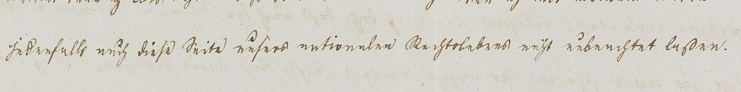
jedenfalls auch diese Seite unsers nationalen Rechtslebens nicht unbeachtet laßen.
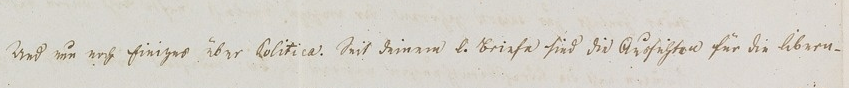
Und nun noch Einiges über Politica. Seit deinem l. Briefe sind die Aussichten für die libera-
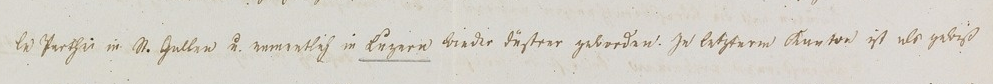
le Parthei in St. Gallen u. namentlich in Luzern wieder düstrer geworden. In letzterm Kanton ist als gewiß
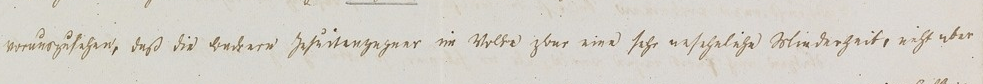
vorauszusehen, daß die wackern Jesuitengegner im Volke zwar eine sehr ansehnliche Minderheit, nicht aber
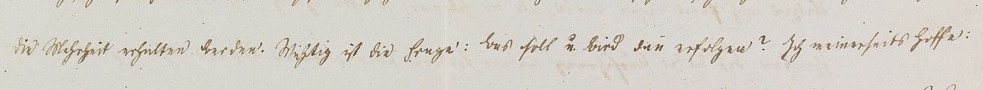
die Mehrheit erhalten werden. Wichtig ist die Frage: was soll u. wird dann erfolgen? Ich meinerseits hoffe:
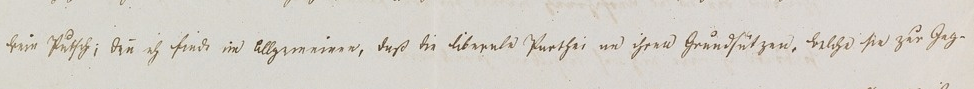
kein Putsch; denn ich finde im Allgemeinen, daß die liberale Parthei an ihren Grundsätzen, welche sie zur Geg-
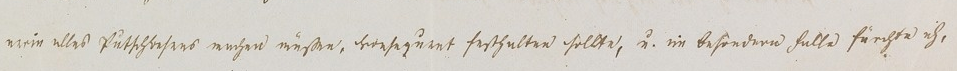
nerin alles Putschwesens machen müßen, konsequent festhalten sollte, u. im besondern Falle fürchte ich,
